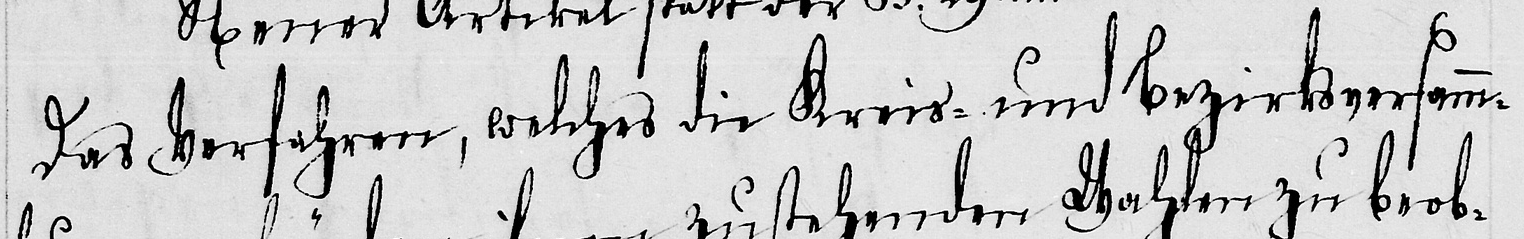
Das Verfahren, welches die Kreis- und Bezirksversam¬
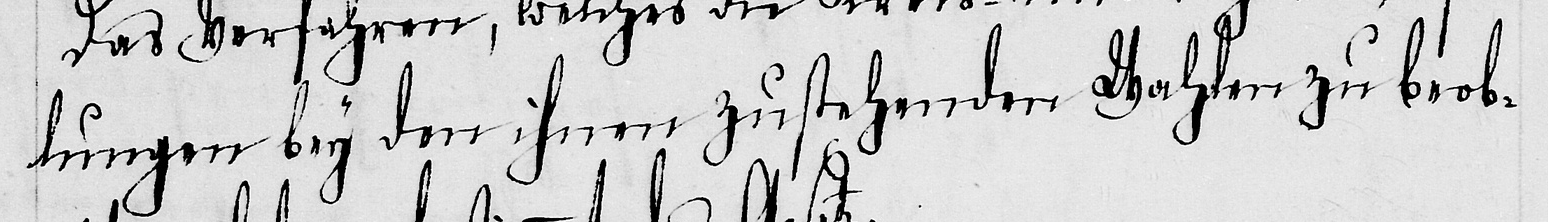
mlungen bey den ihnen zustehenden Wahlen zu beob¬
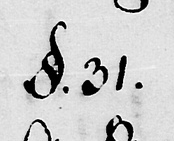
§. 31.
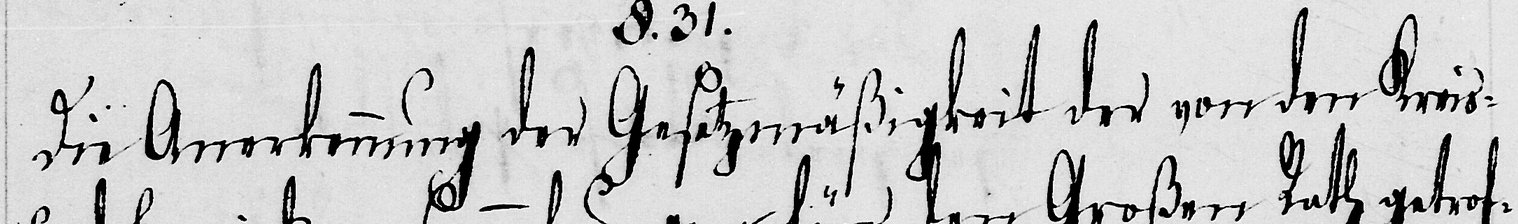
Die Anerkennung der Gesetzmäßigkeit der von den Kreis-
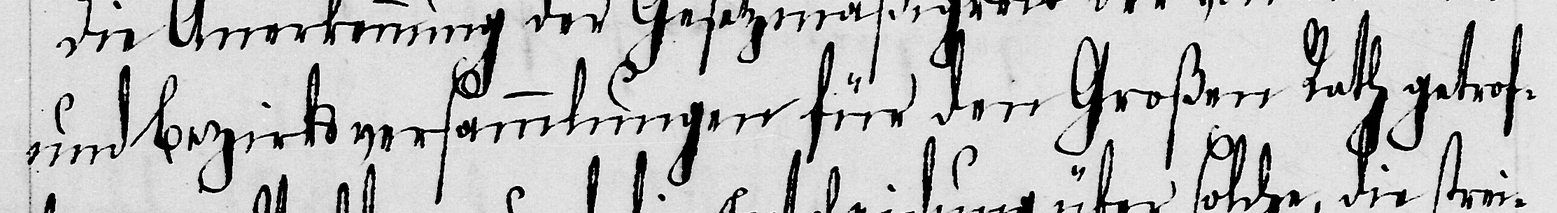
und Bezirksversammlungen für den Großen Rath getro¬
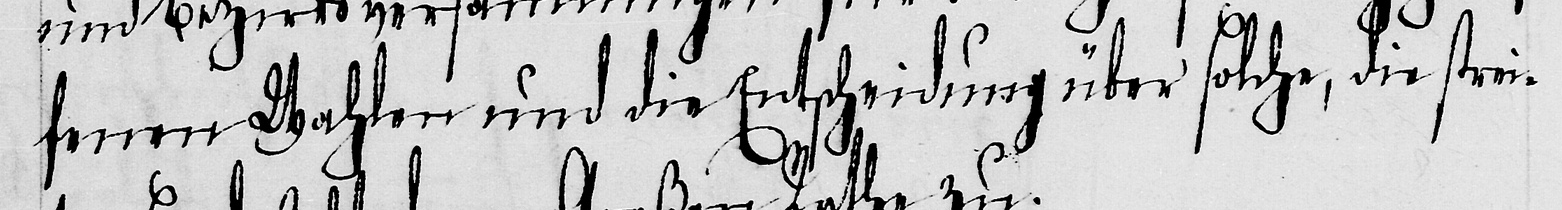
fenen Wahlen und die Entscheidung über solche, die str¬
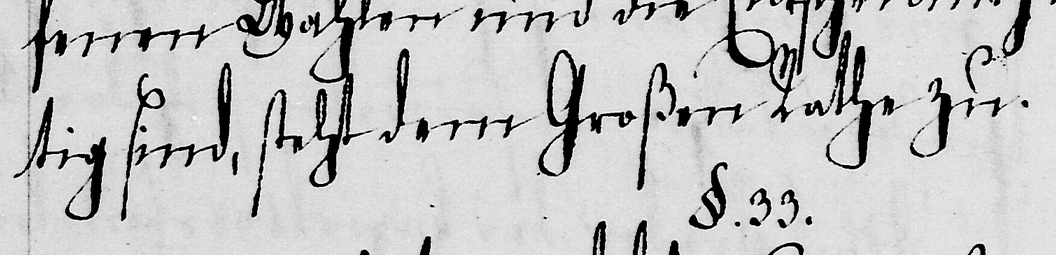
tig sind, steht dem Großen Rathe zu.
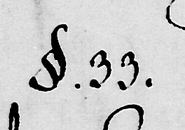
§. 33.
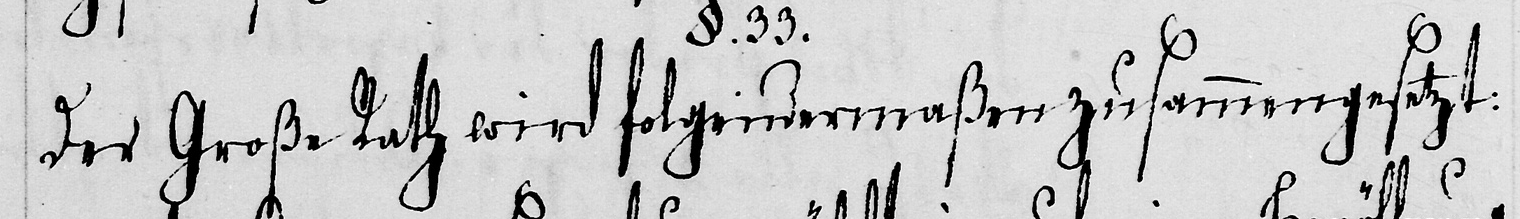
Der Große Rath wird folgendermaßen zusammengesetzt:
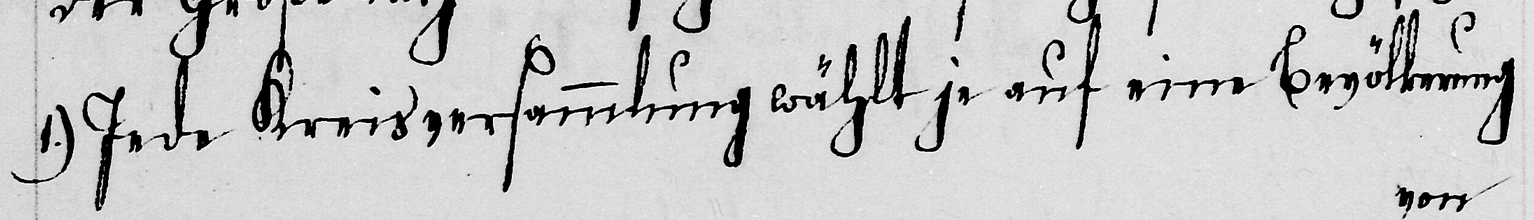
1.) Jede Kreisversammlung wählt je auf eine Bevölkerung
